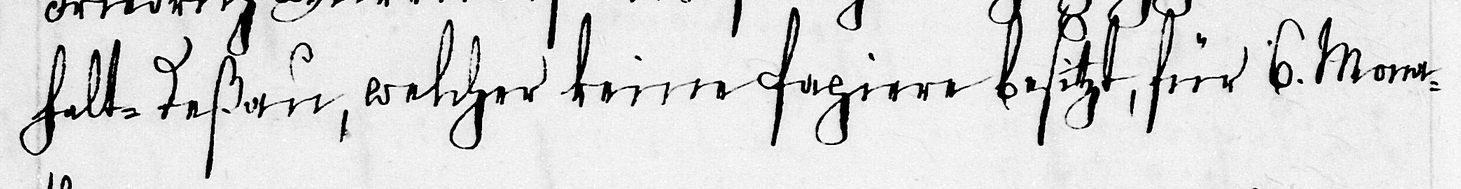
halt-Deßau, welcher keine Papiere besitzt, für 6. Mona¬
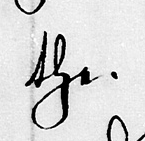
the.
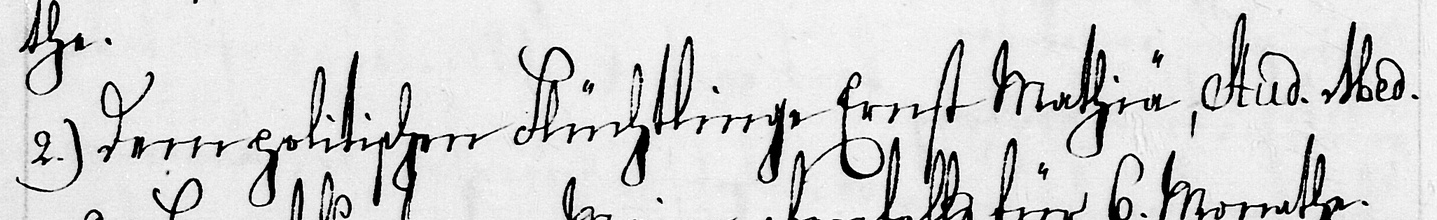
2.) Dem politischen Flüchtlinge Ernst Mathiä, Stud. Med.
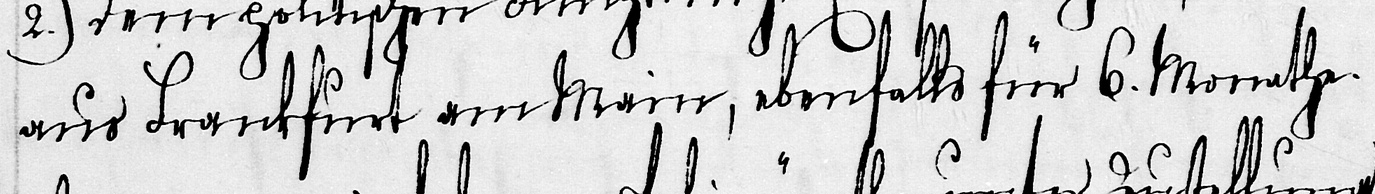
aus Frankfurt am Main, ebenfalls für 6. Monathe.
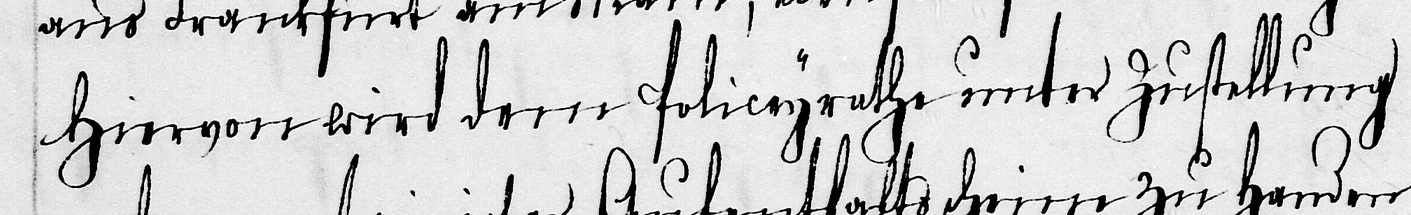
Hiervon wird dem Policeyrathe unter Zustellung
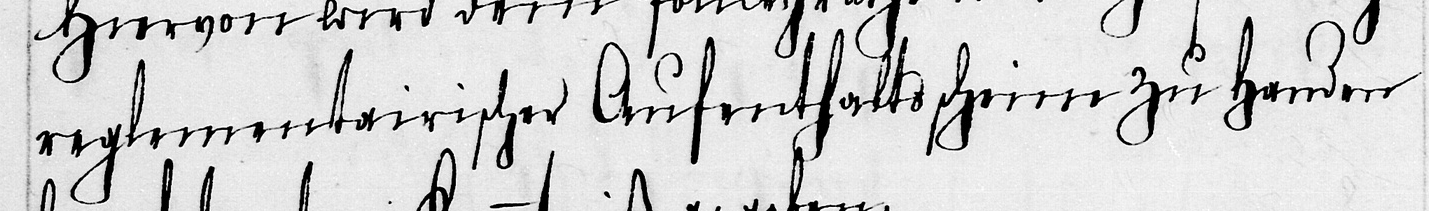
reglementairischer Aufenthaltsscheine zu Handen
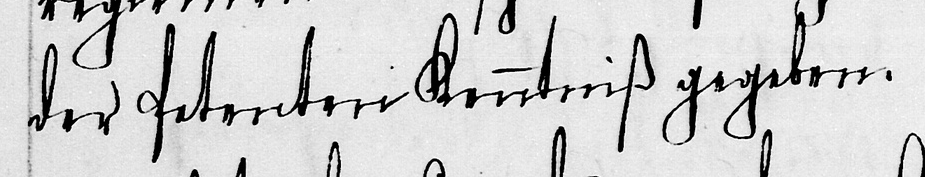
der Petenten Kenntniß gegeben.
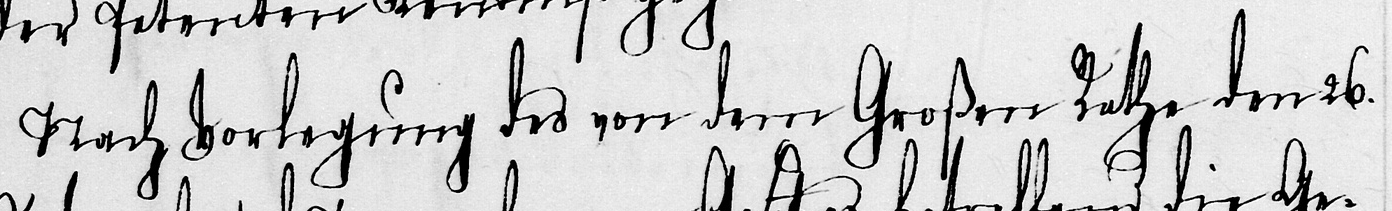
Nach Vorlegung des von dem Großen Rathe den 26.
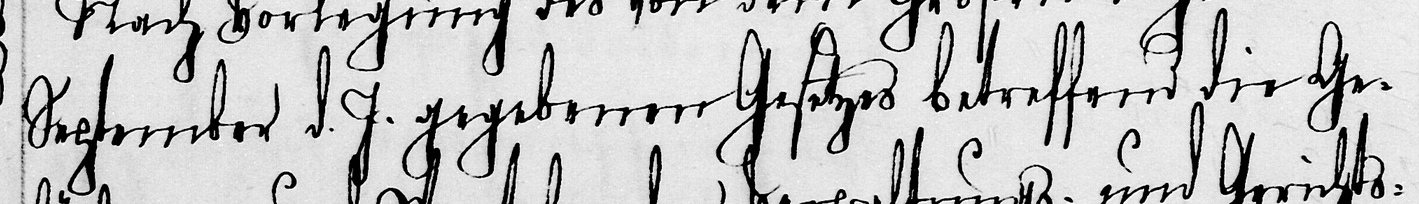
September d. J. gegebenen Gesetzes betreffend die Ge¬
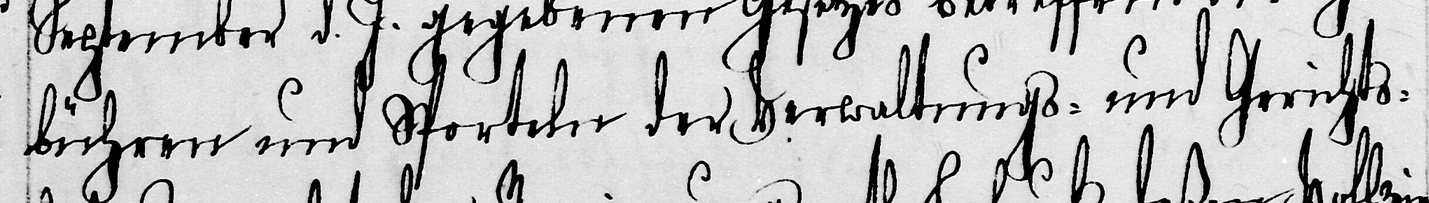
bühren und Sporteln der Verwaltungs- und Gerichts¬
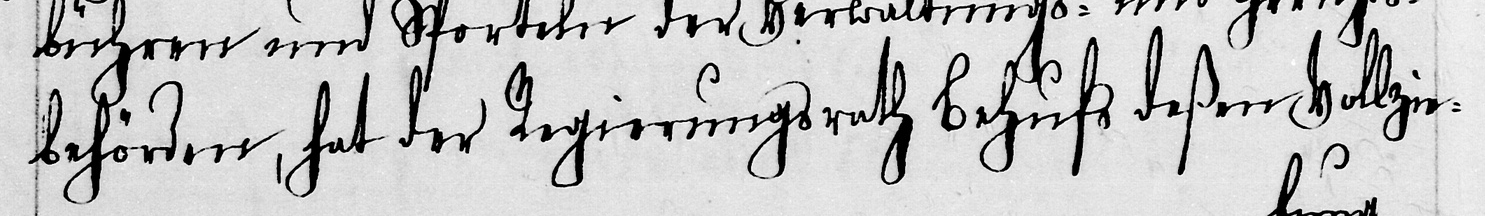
behörden, hat der Regierungsrath Behufs deßen Vollzi¬
